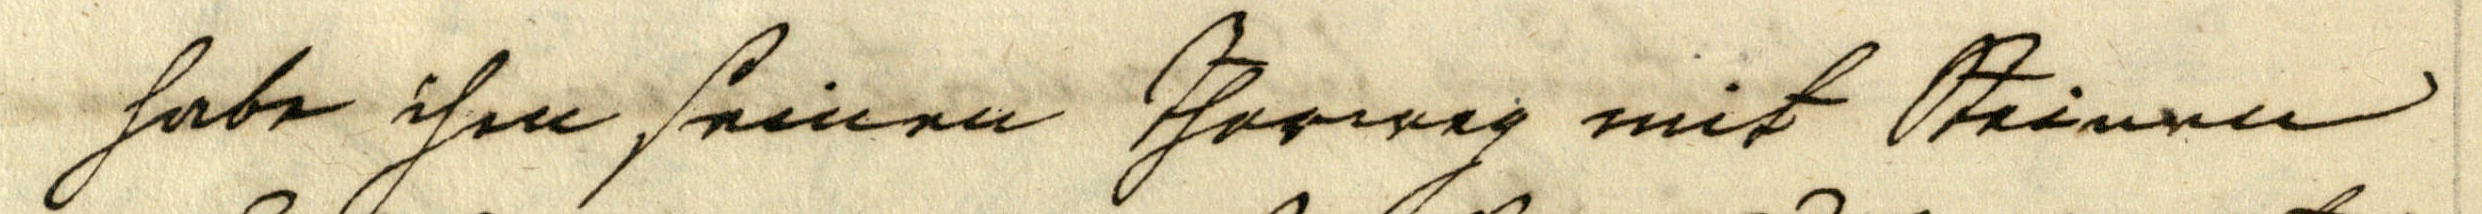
habe ihm seinen Thorweg mit Steinen
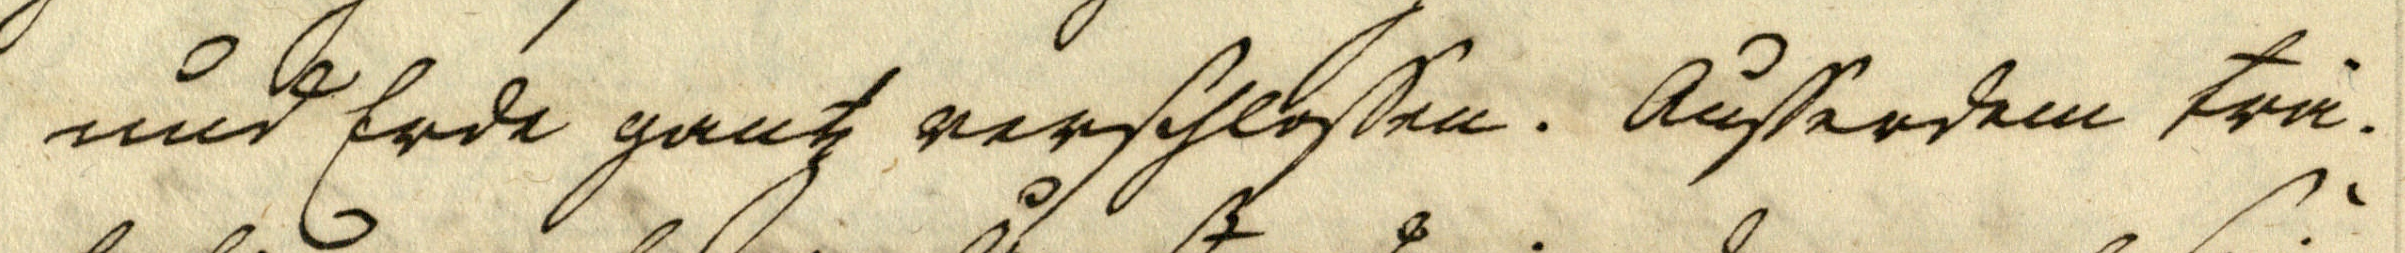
und Erde gantz verschlossen. Ausserdem trä-
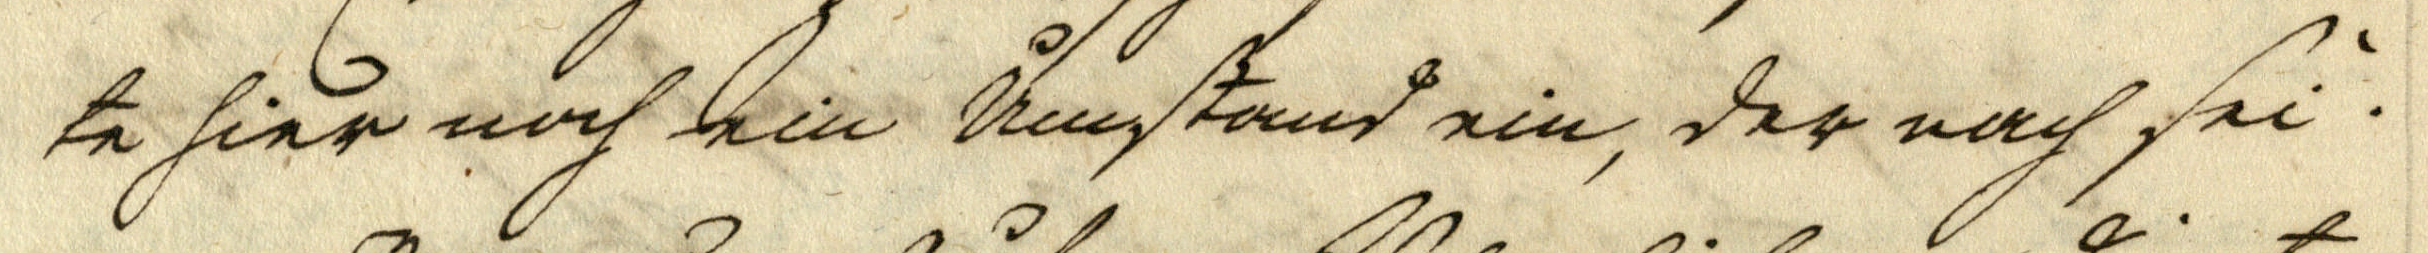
te hier noch ein Umstnad ein, der nach sei-
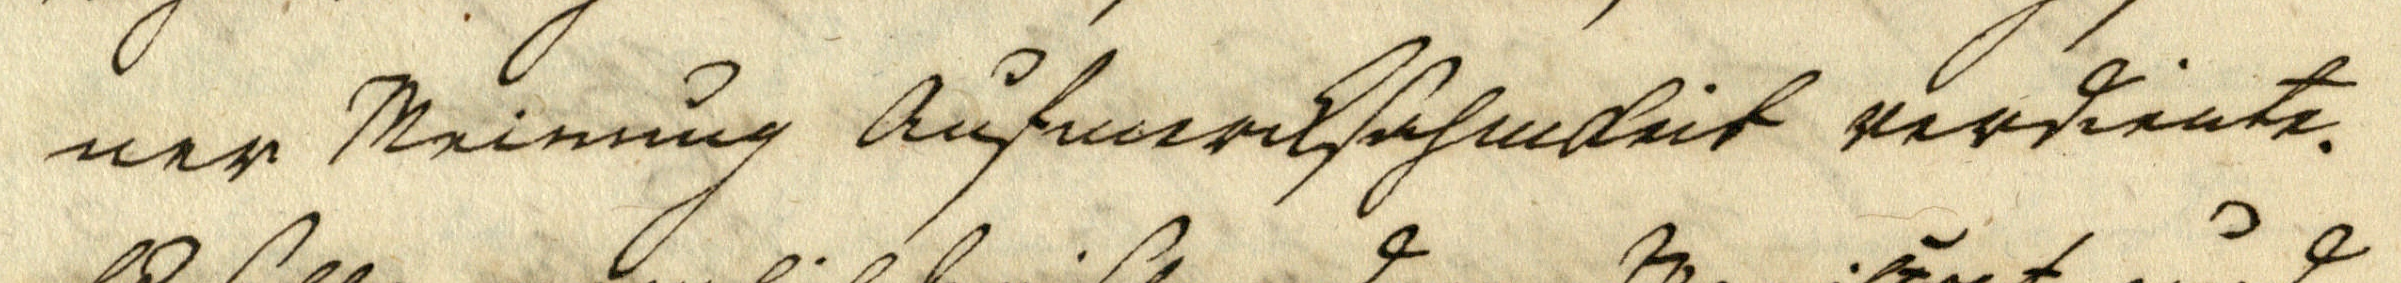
ner Meinung Aufmerksahmkeit verdiente.
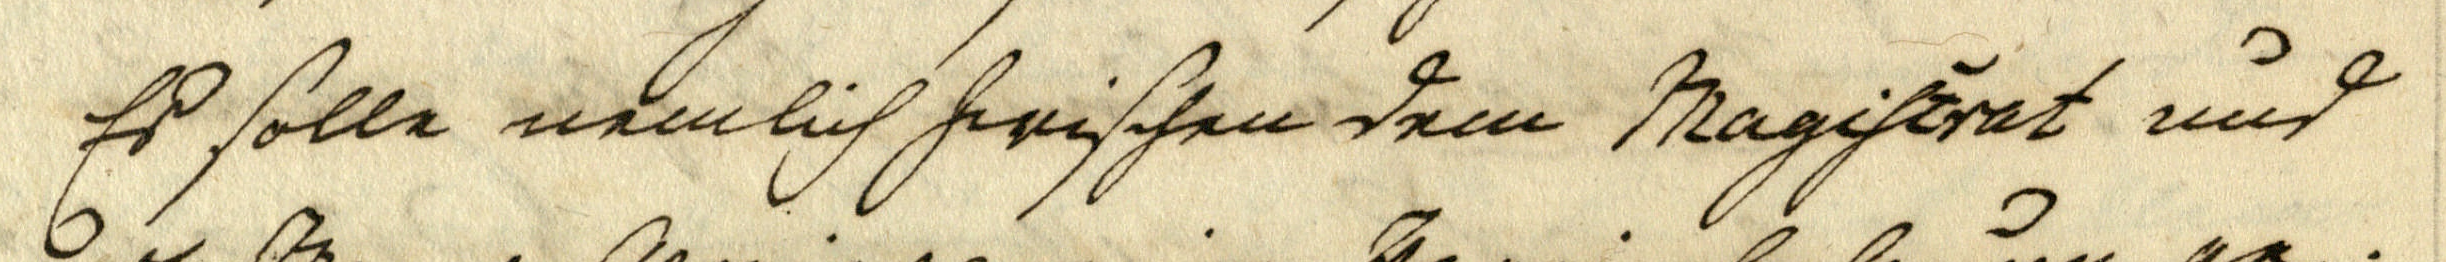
Es solle nemlich zwischen dem Magistrat und
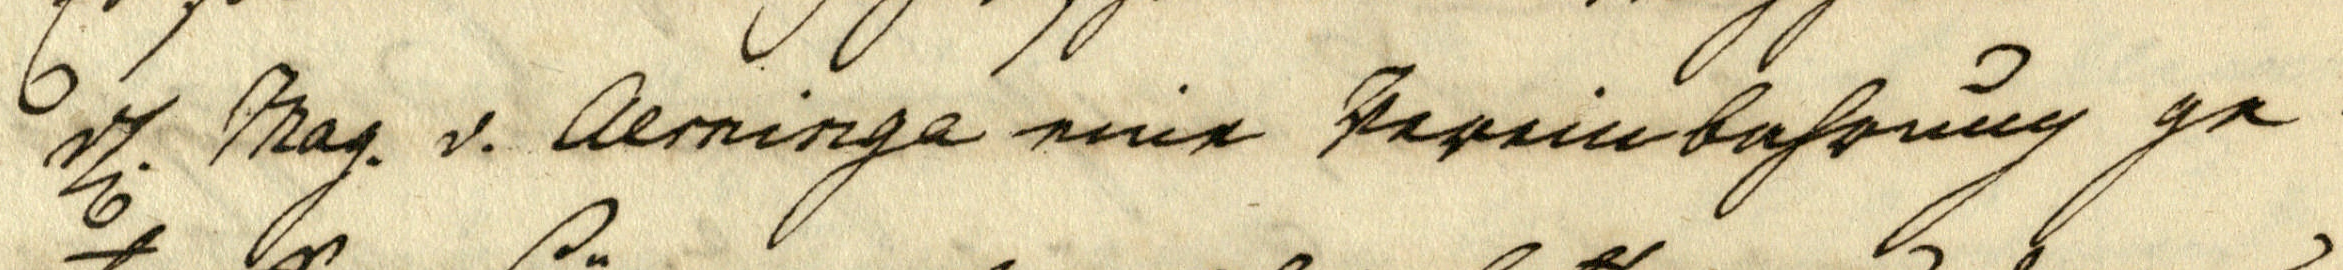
dh. Mag. v. Aeminga eine Verinbahrung ge-
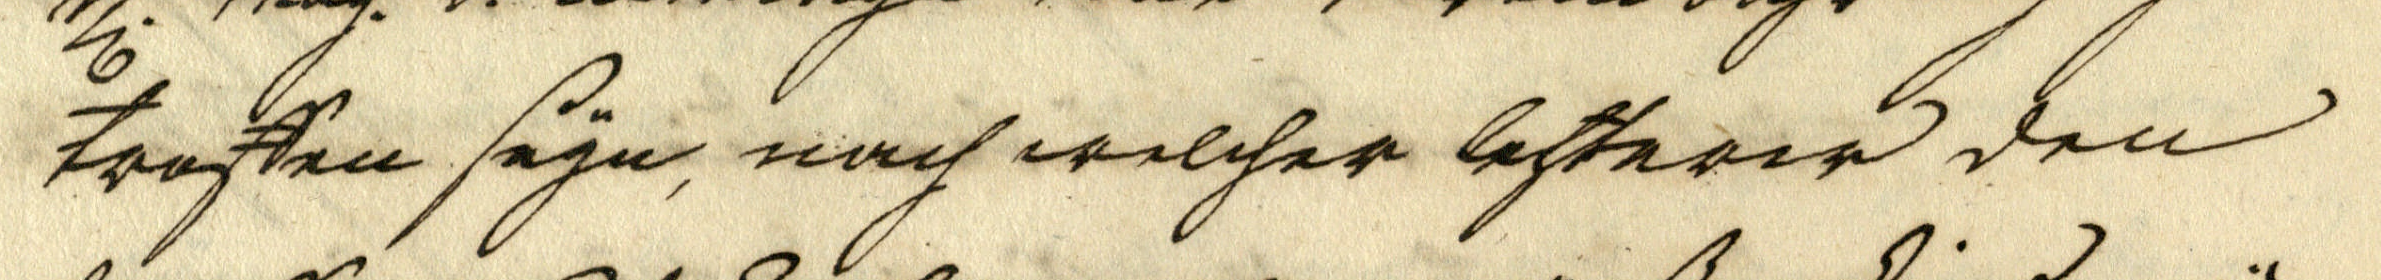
troffen seyn, nach welcher letzterer den
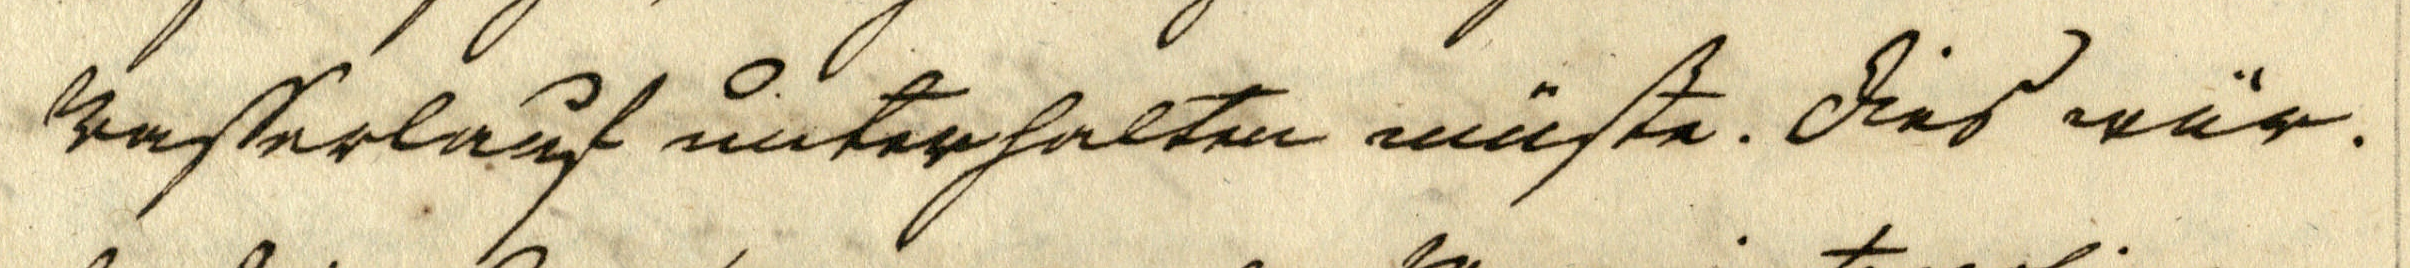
Wasserlauf unterhalten müßte. Dies wür-
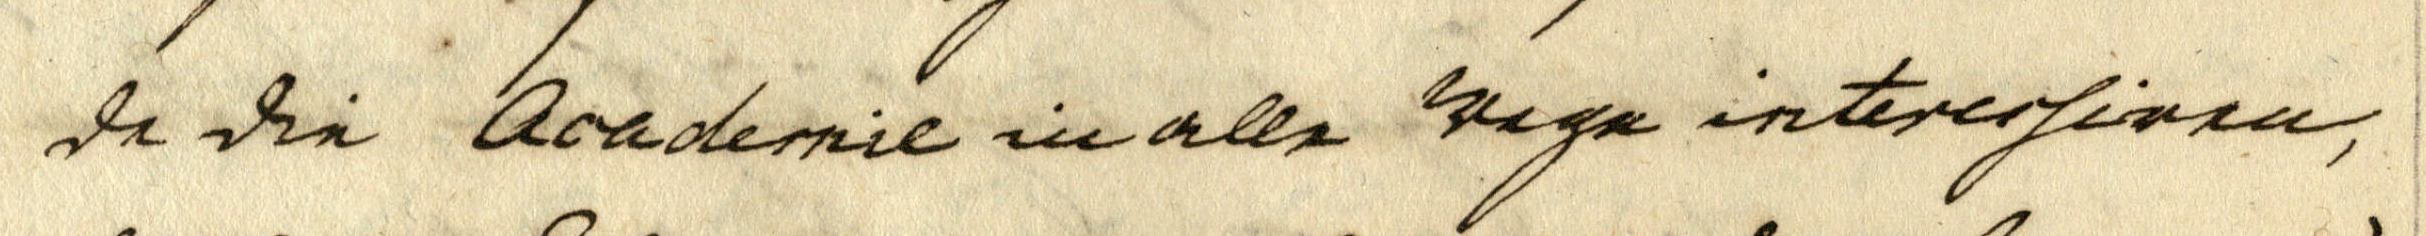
de die Academie in alle Wege interessiren,
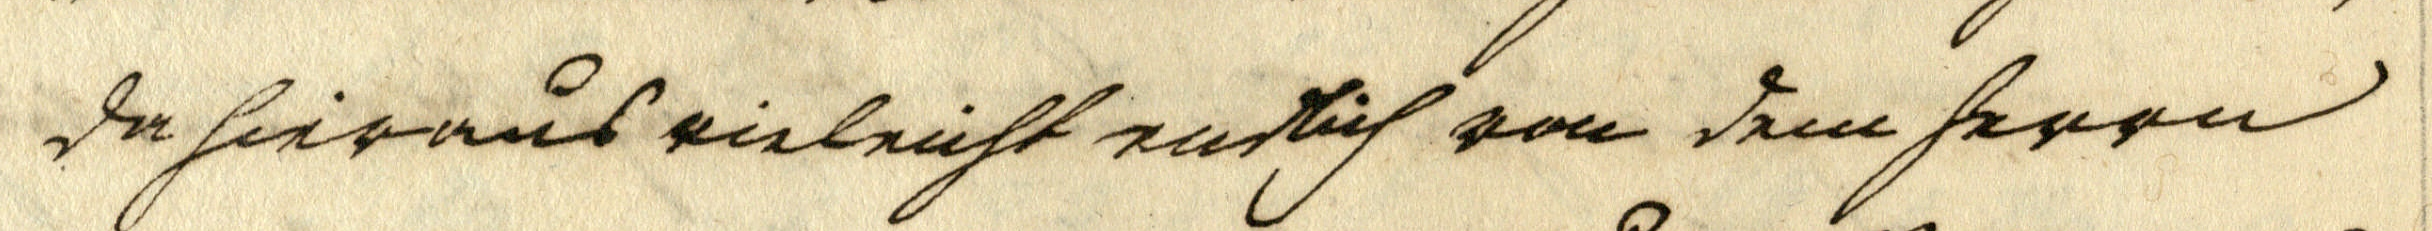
da hieraus vieleicht endlich von dem Herrn
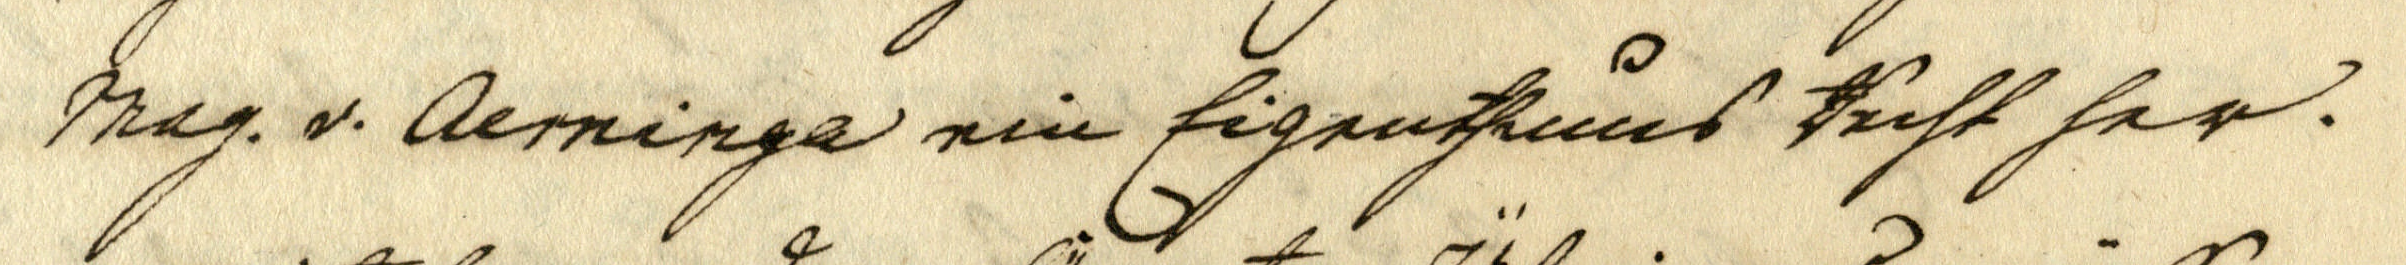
Mag. v. Aeminga ein Eigenthums Recht her-
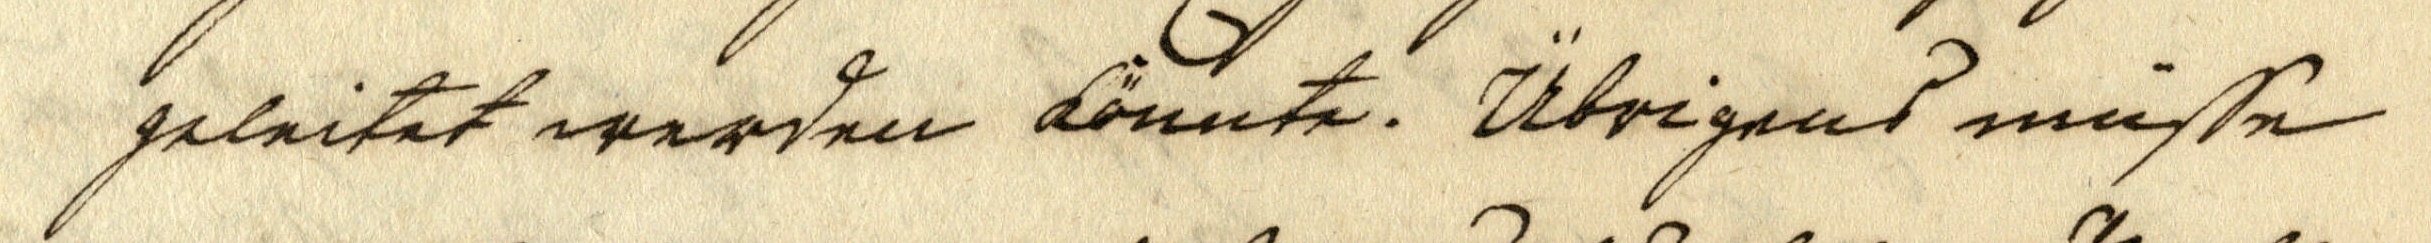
geleitet werden könnte. Übrigens müsse
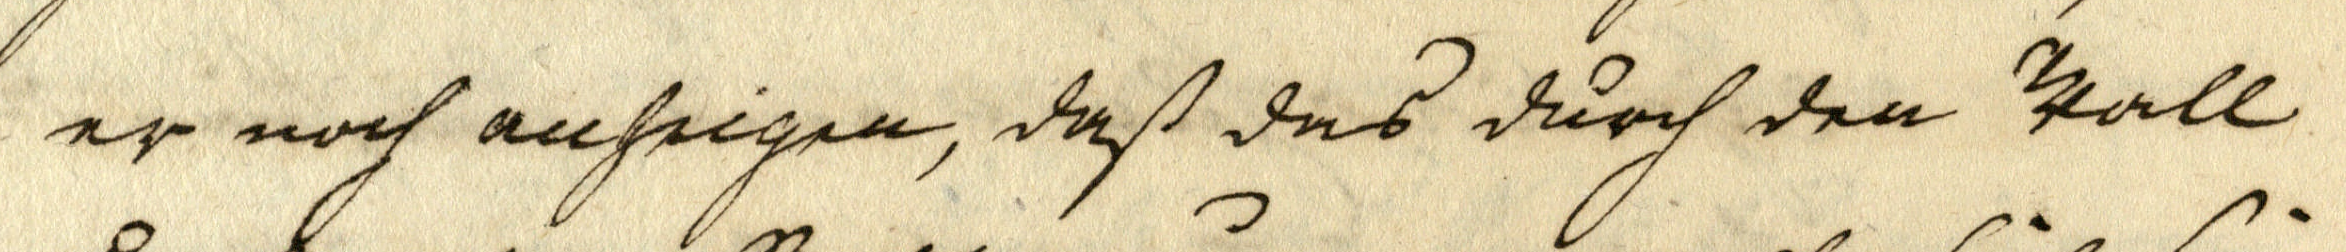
er noch anzeigen, daß das durch den Wall
